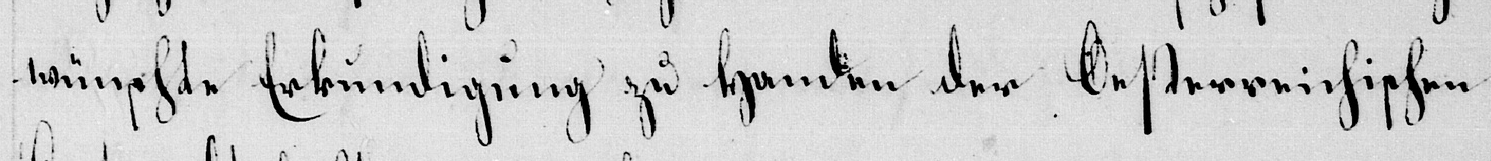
wünschte Erkundigung zu Handen der Oesterreichischen
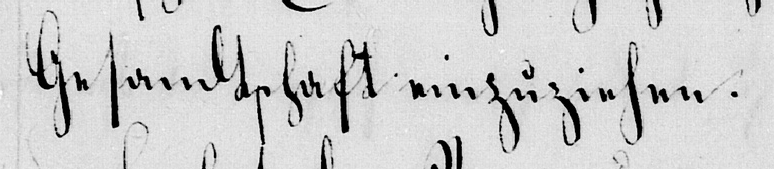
Gesandtschaft einzuziehen.
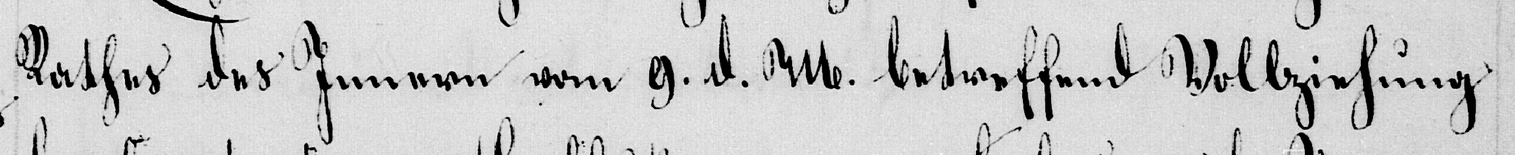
Rathes des Innern vom 9. d. M. betreffend Vollziehung
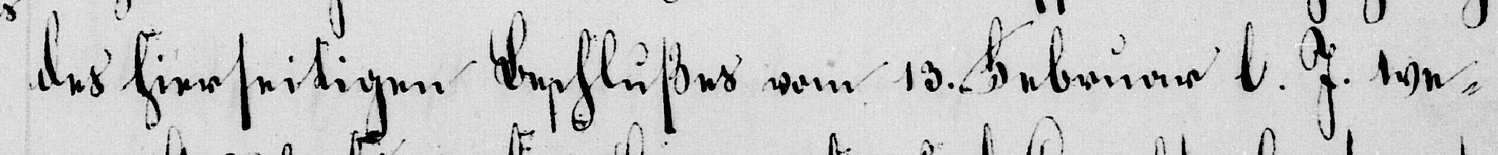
des hierseitigen Beschlußes vom 13. Februar l. J. we¬
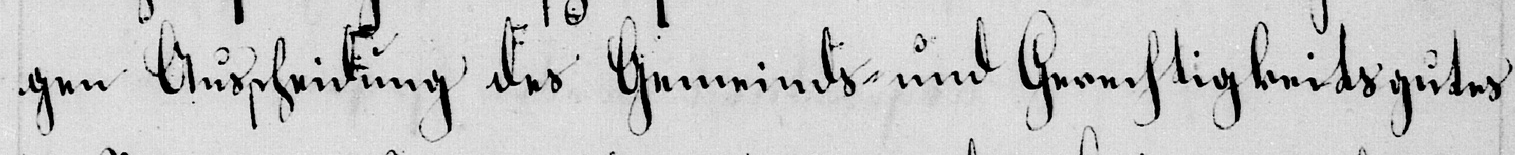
gen Ausscheidung des Gemeinds- und Gerechtigkeitsgutes
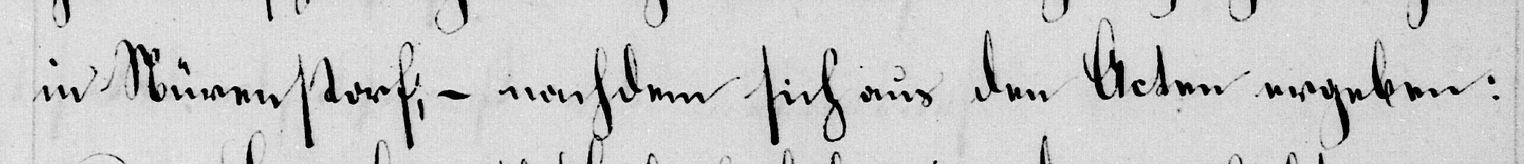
in Nürenstorf, – nachdem sich aus den Acten ergeben:
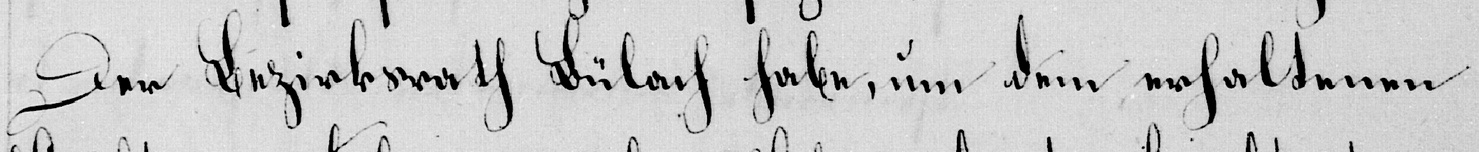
Der Bezirksrath Bülach habe, um dem erhaltenen
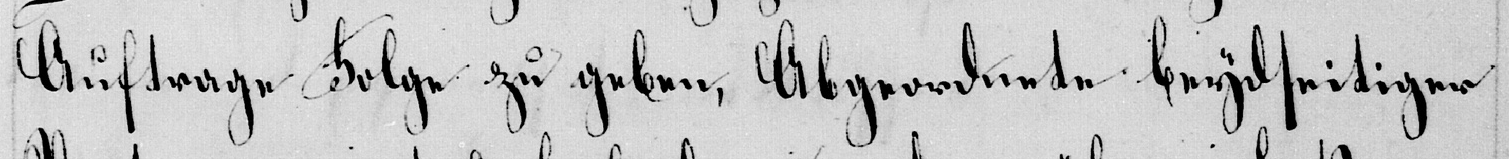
Auftrage Folge zu geben, Abgeordnete beydseitiger
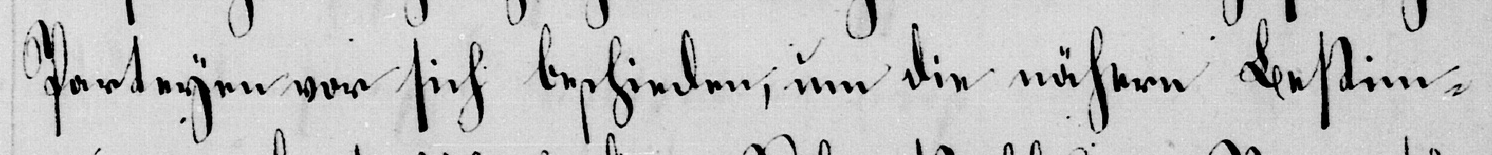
Parteyen vor sich beschieden, um die nähern Bestim¬
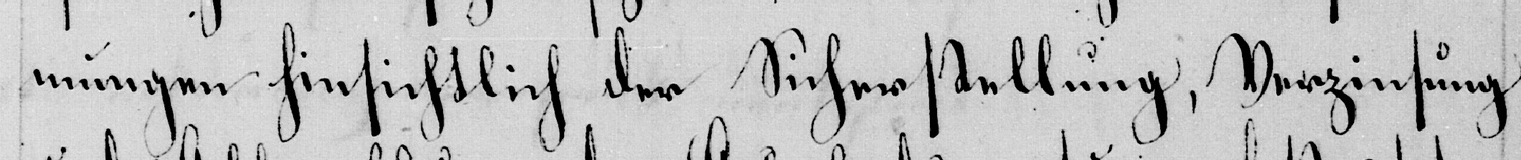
mungen hinsichtlich der Sicherstellung, Verzinsung
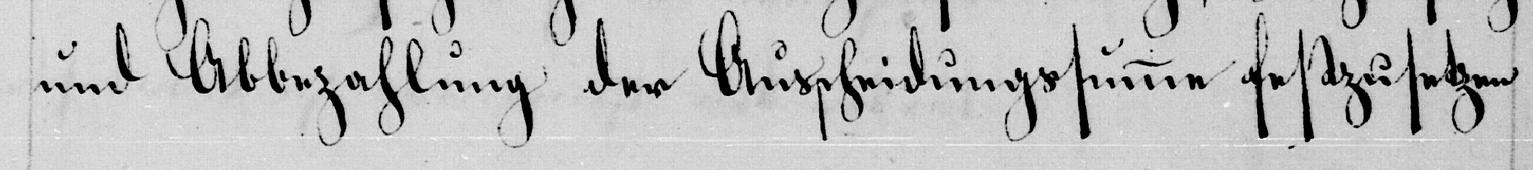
und Abbezahlung der Ausscheidungssumme festzusetzen
